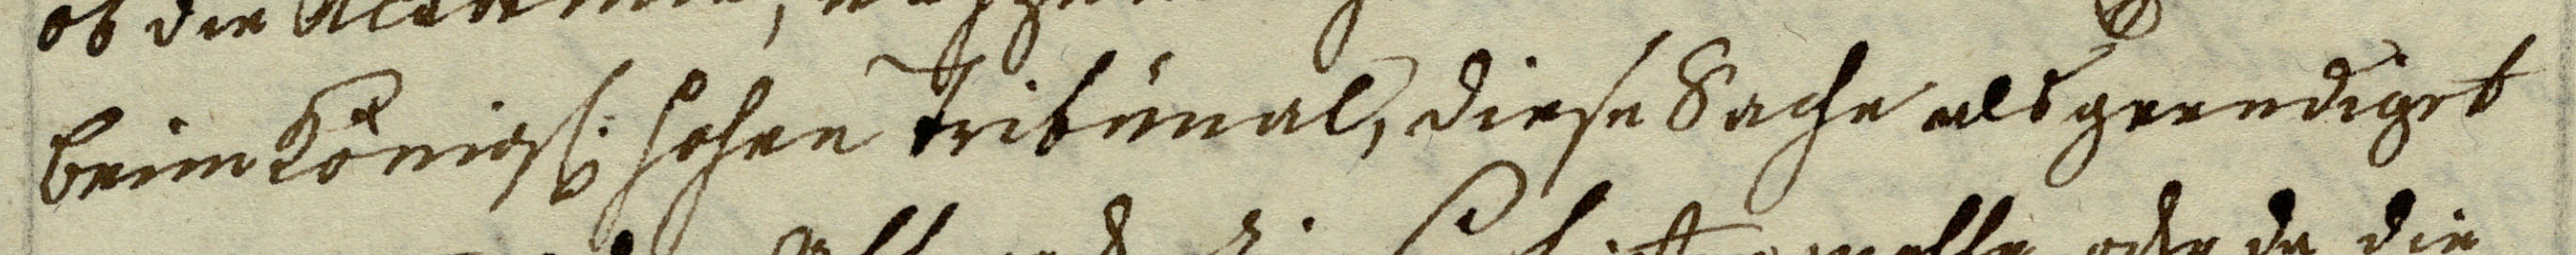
beim Königl. hohen Tribunal, diese Sache als geendiget
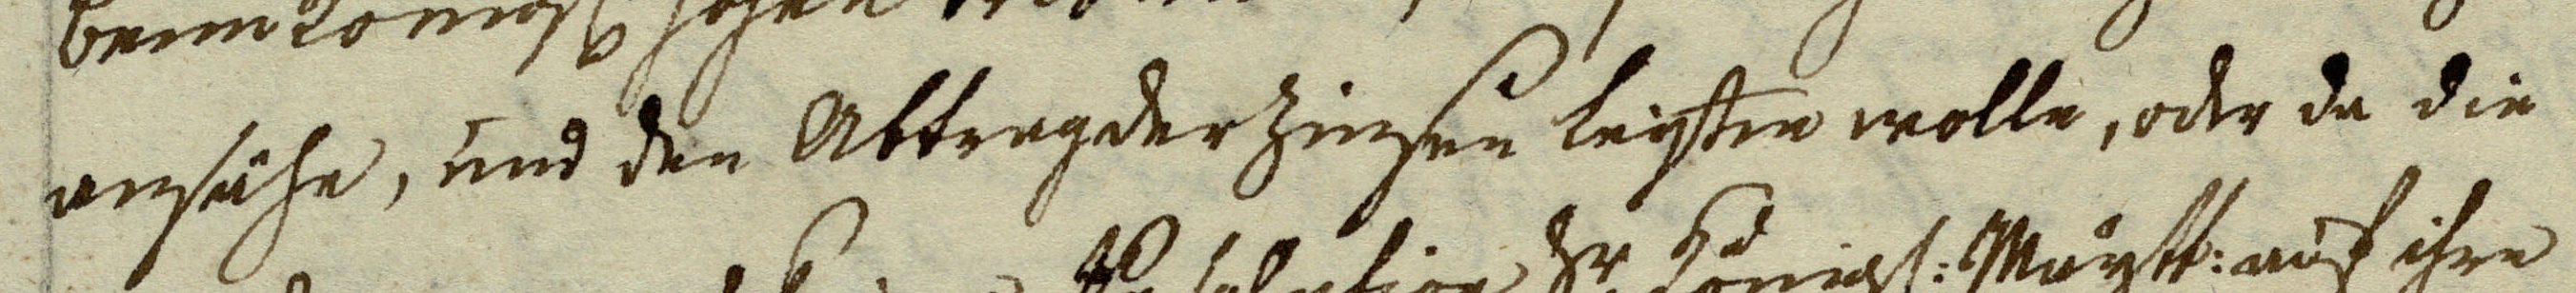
ansähe, und den Abtrag der Zinsen leisten wolle, oder da die
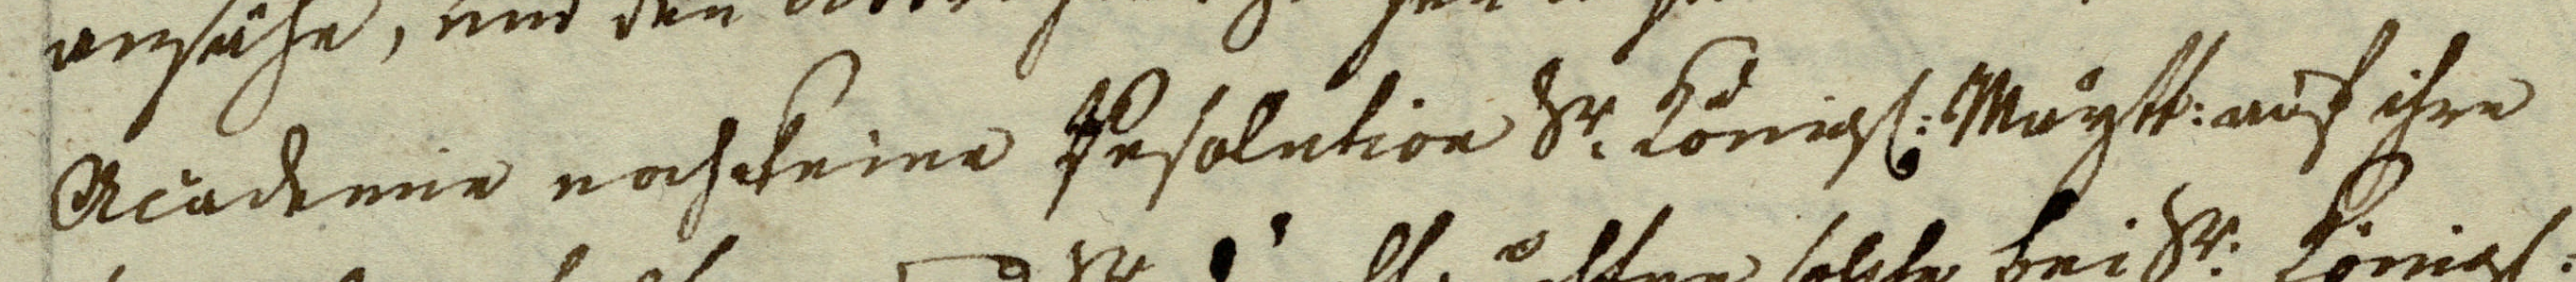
Academie noch keine Resolution Sr. Königl. Maÿtt. auf ihre
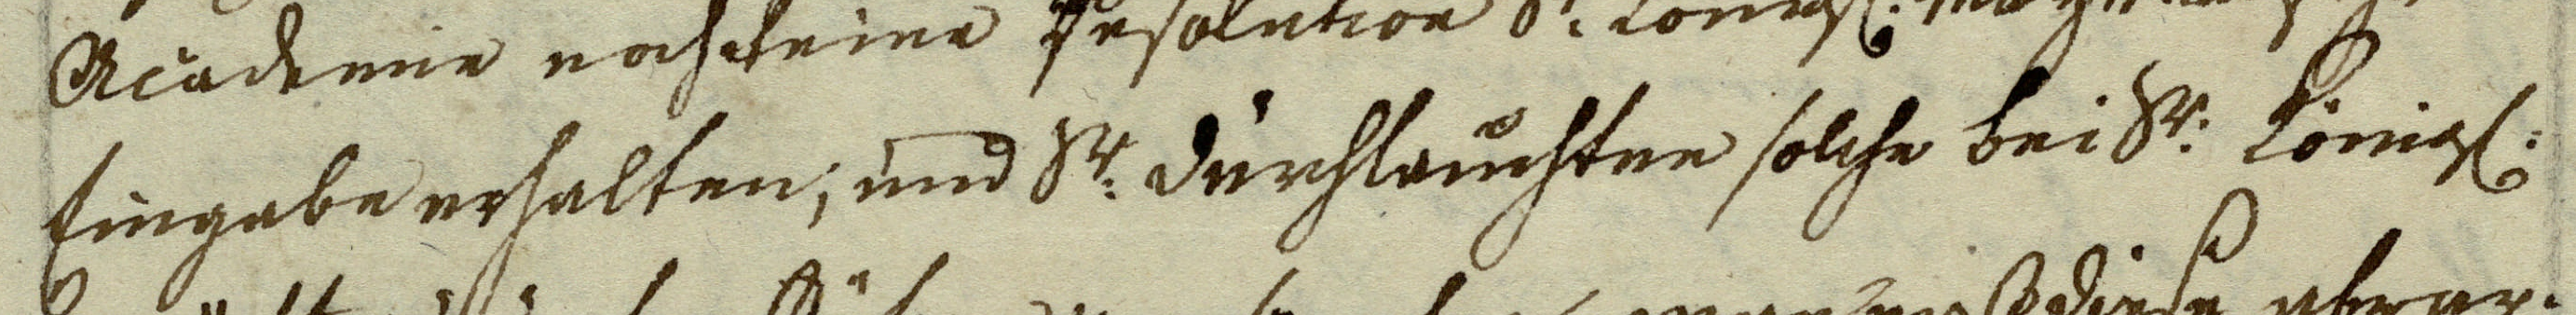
Eingabe erhalten, und Sr. Durchlauchten solche bei Sr. Königl.
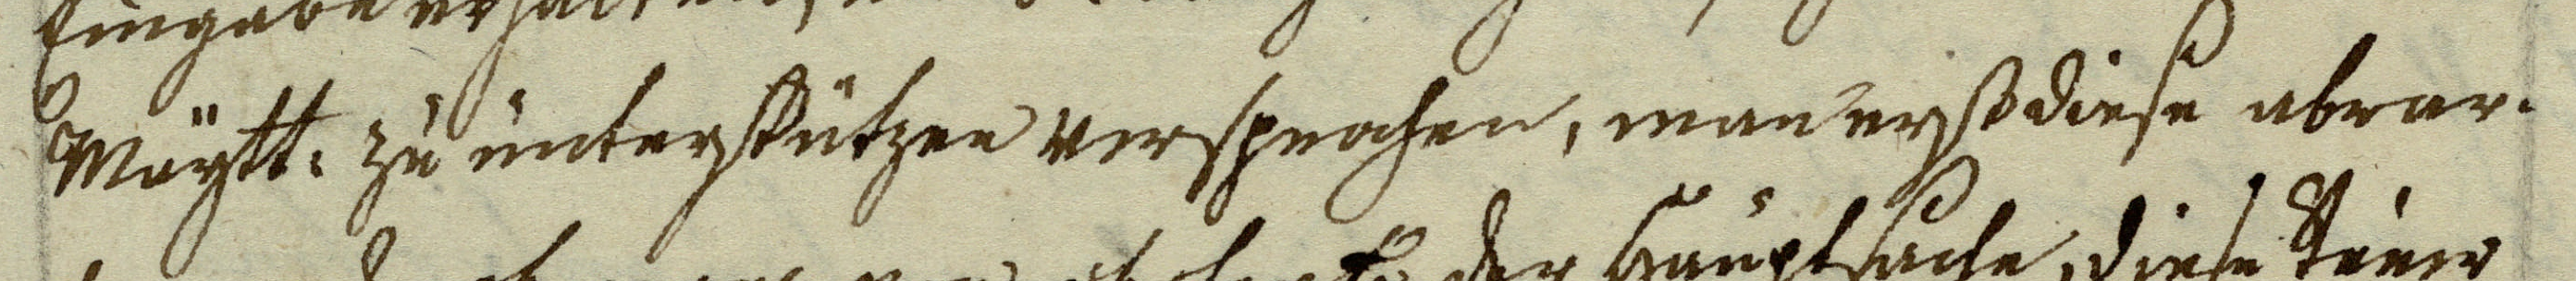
Maÿtt. zu unterstützen versprochen, man erst diese abwar¬
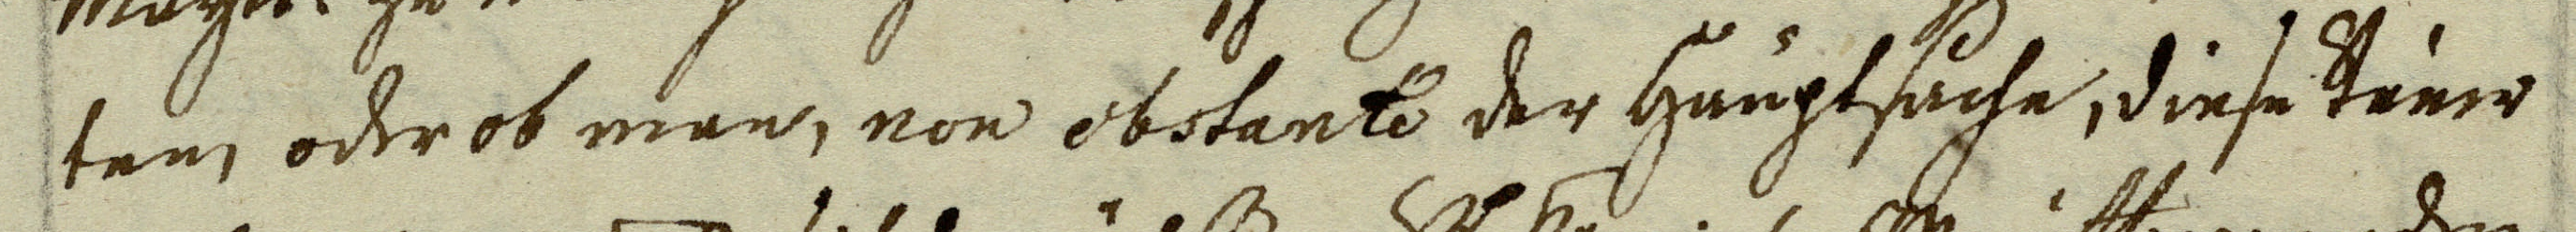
ten, oder ob man, non obstante der Hauptsache, diese Steuer
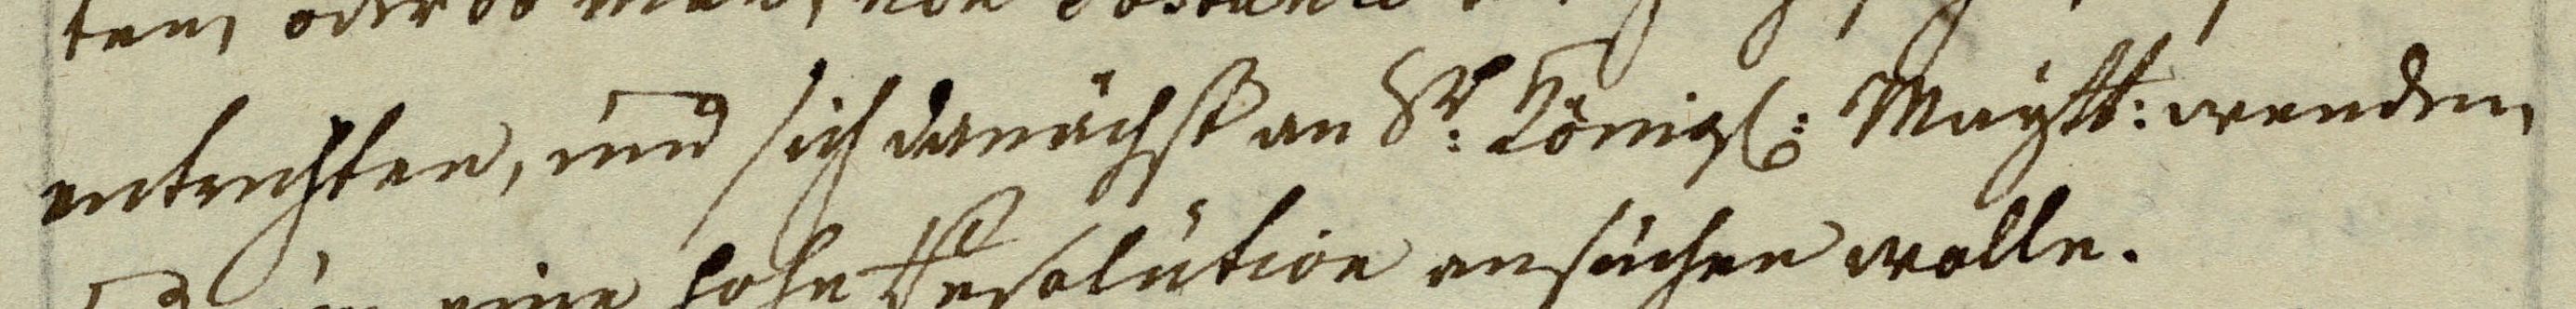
entrichten, und sich danächst an Sr. Königl. Maÿtt. wenden
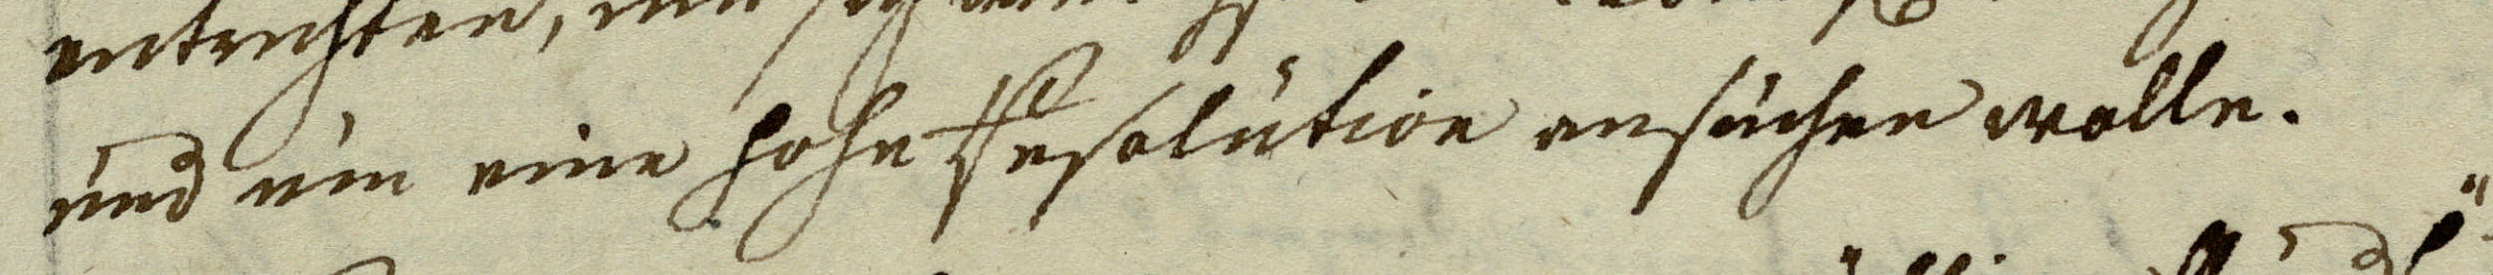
und um eine hohe Resolution ansuchen wolle.
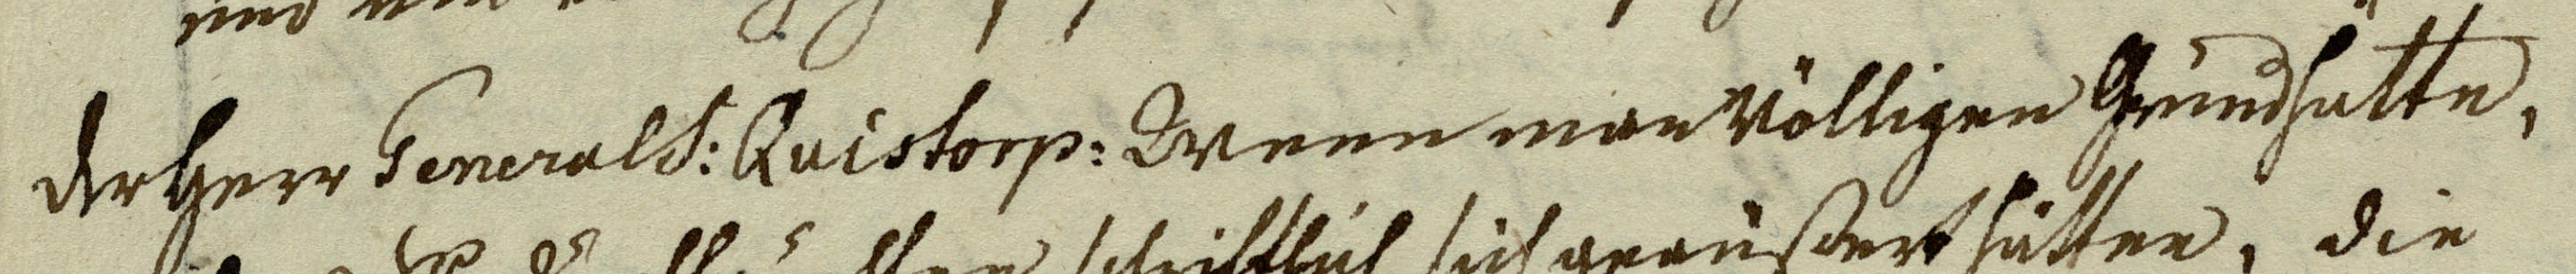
der Herr Generals. Quistorp: Wenn man völligen Grund hätte,
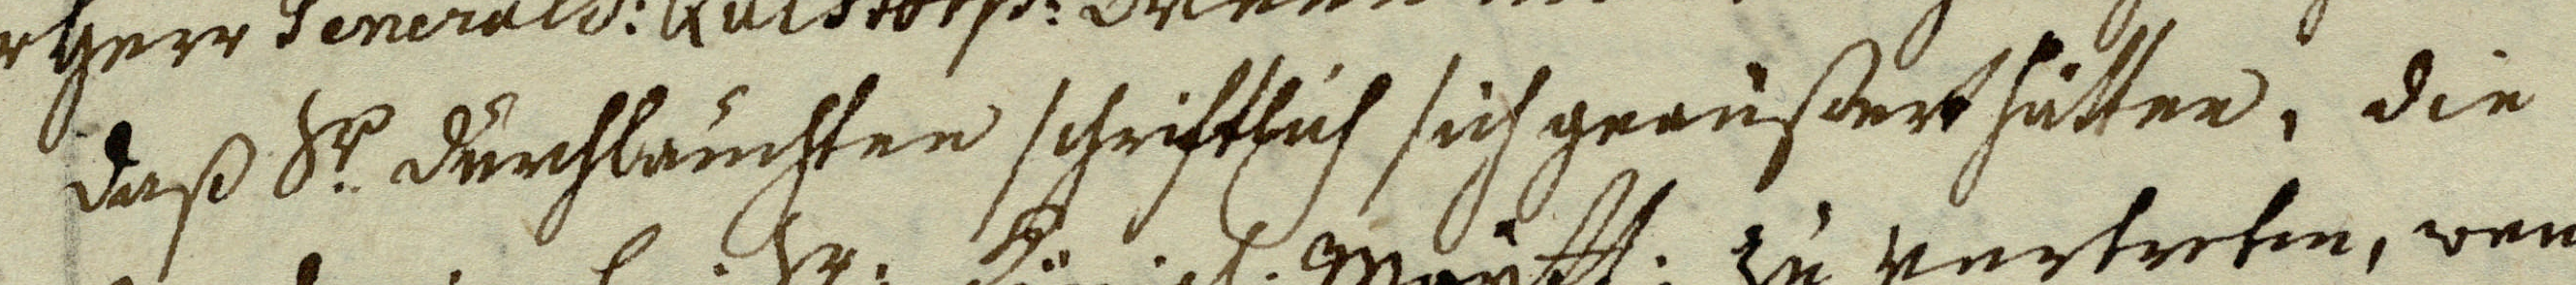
daß Sr. Durchlauchten schriftlich sich geäußert hätten, die
